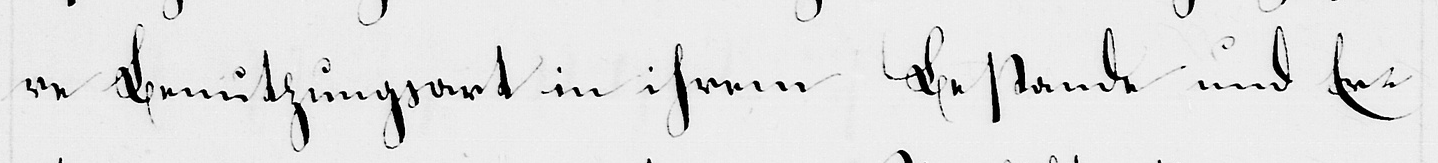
re Benutzungsart in ihrem Bestande und Er¬
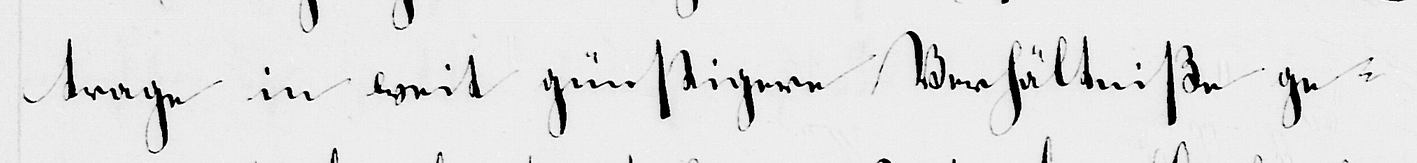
trage in weit günstigere Verhältniße ge¬
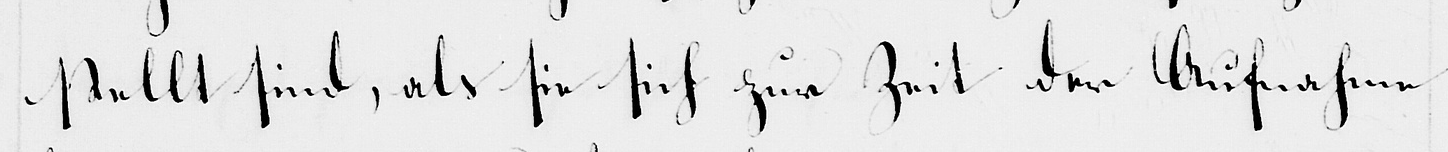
stellt sind, als sie sich zur Zeit der Aufnahme
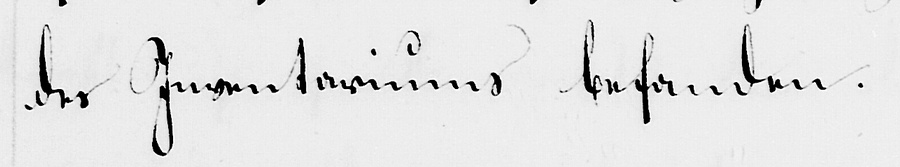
der Inventariums befanden.
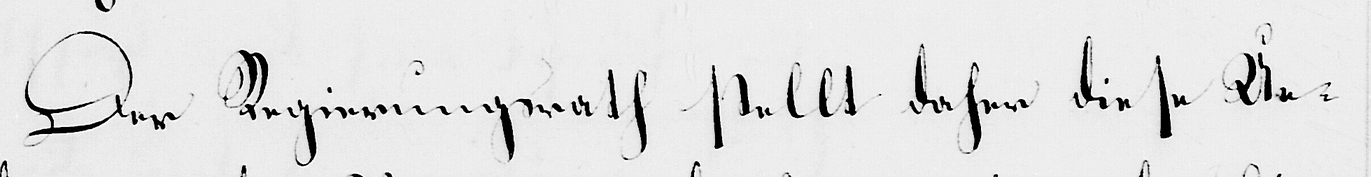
Der Regierungsrath stellt daher diese Ue¬
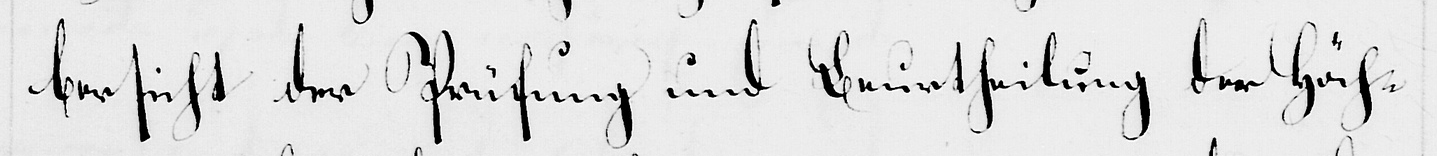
bersicht der Prüfung und Beurtheilung der Höch¬
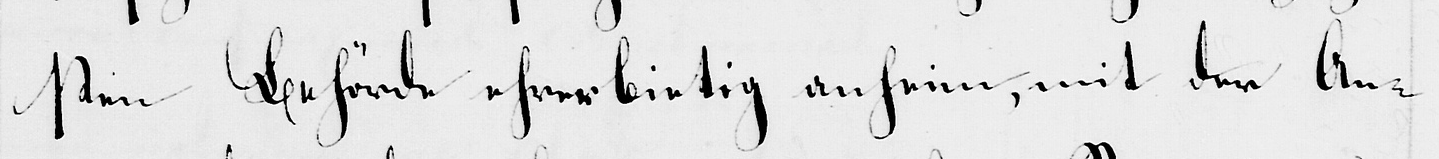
sten Behörde ehrerbietig anheim, mit der An¬
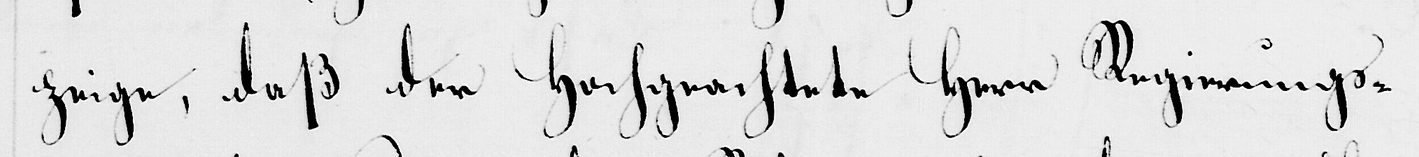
zeige, daß der Hochgeachtete Herr Regierungs¬
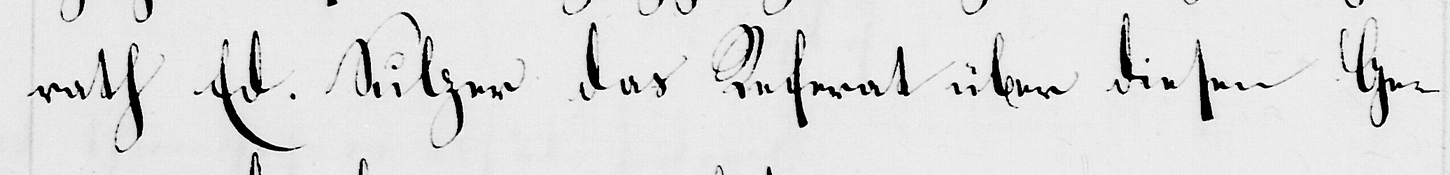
rath Ed. Sulzer das Referat über diesen Ge¬
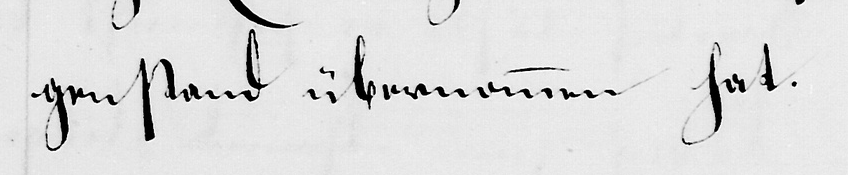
genstand übernommen hat.
